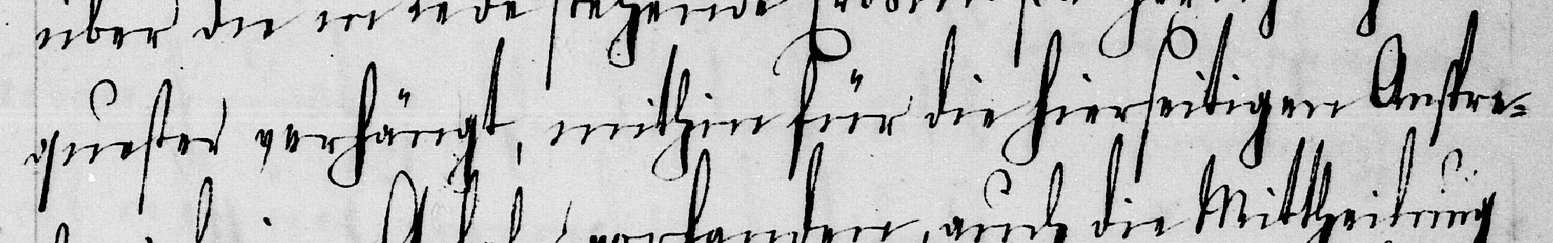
quester verhängt, mithin für die hierseitigen Anspre¬
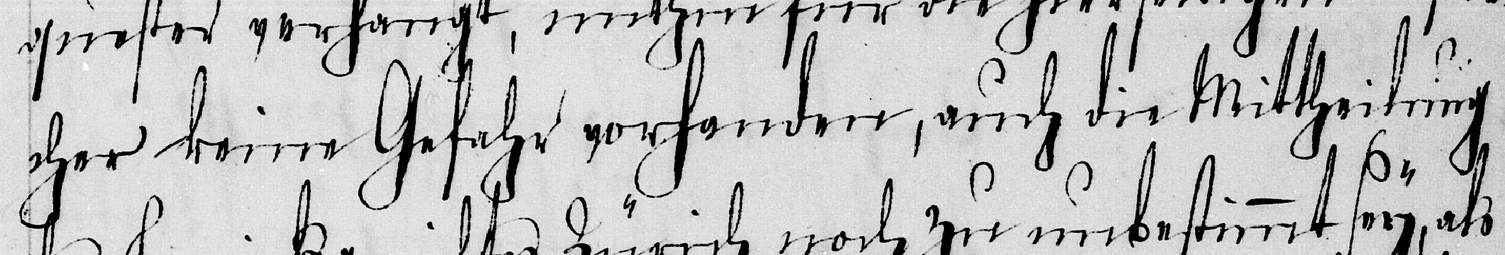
cher keine Gefahr vorhanden, auch die Mittheilung
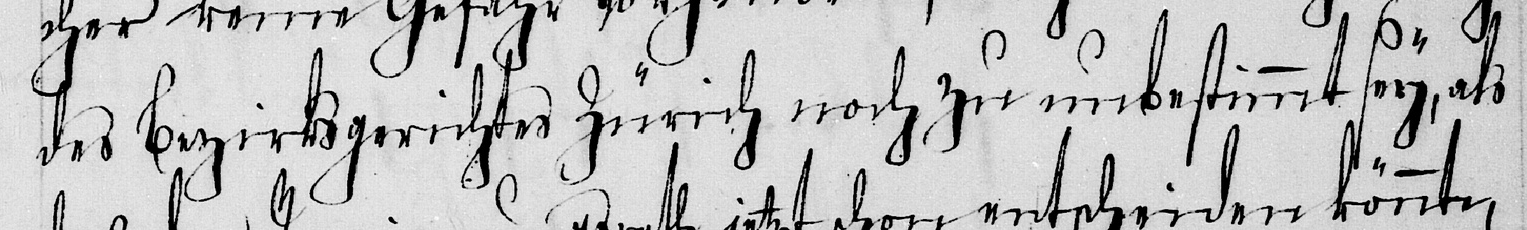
des Bezirksrgerichtes Zürich noch zu unbestimmt sey, als
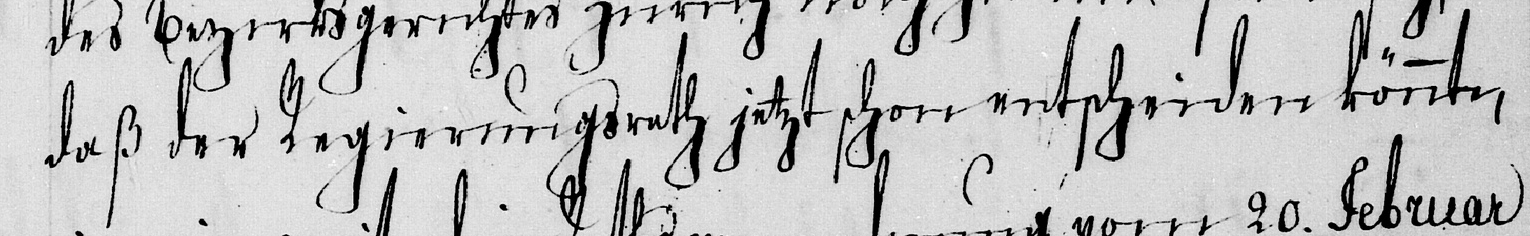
daß der Regierungsrath jetzt schon enscheiden könnte,
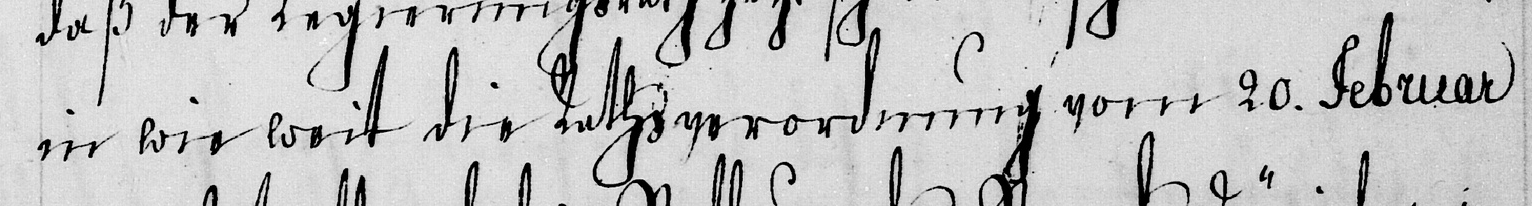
in wie weit die Rathsverordnung vom 2. Februar
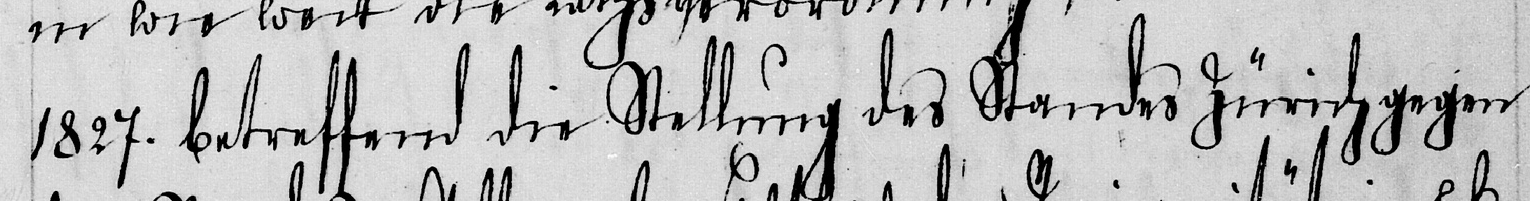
1827. betreffend die Stellung des Standes Zürich gegen
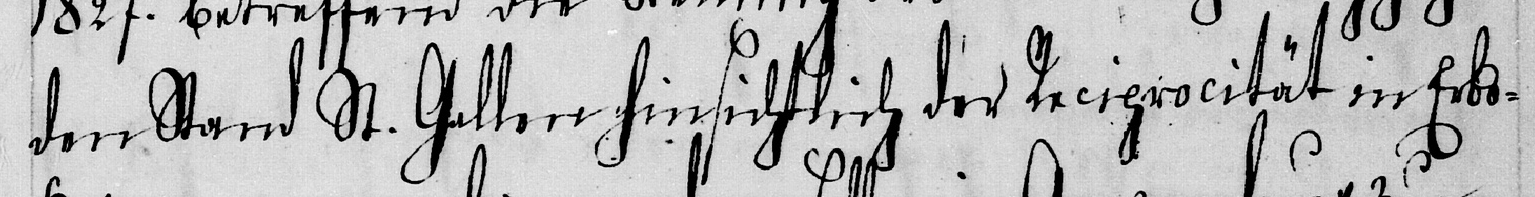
den Stand St. Gallen hinsichtlich der Reciprocität in Erb¬
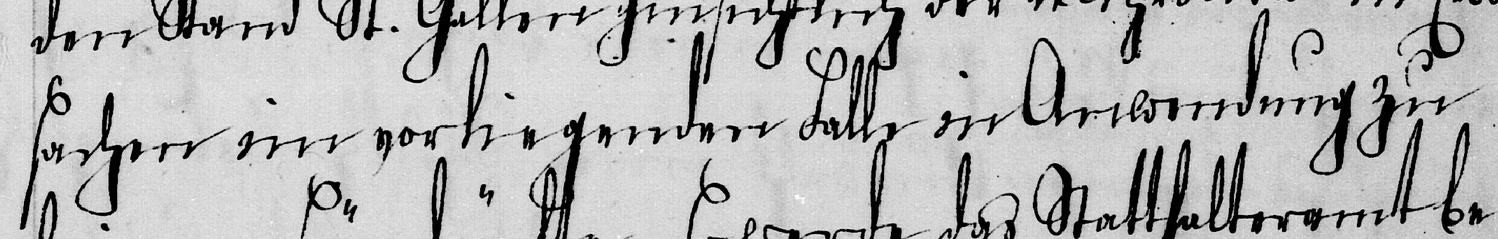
sachen im vorliegenden Falle in Anwendung zu
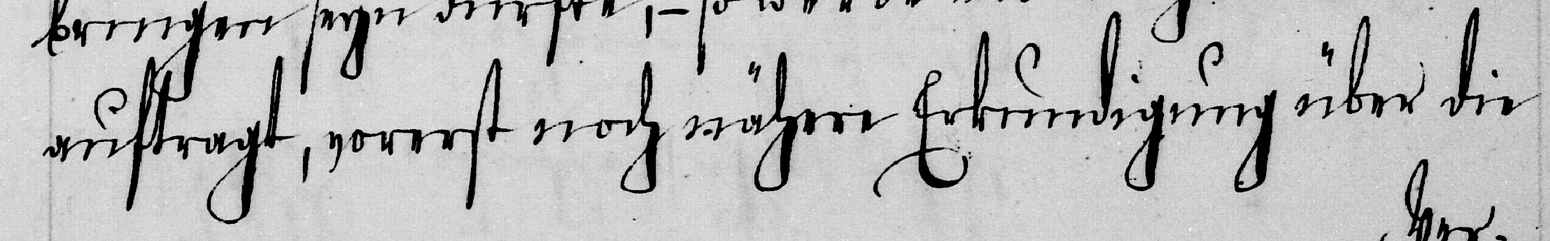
eauftragt, vorerst noch nähere Erkundigung über die
